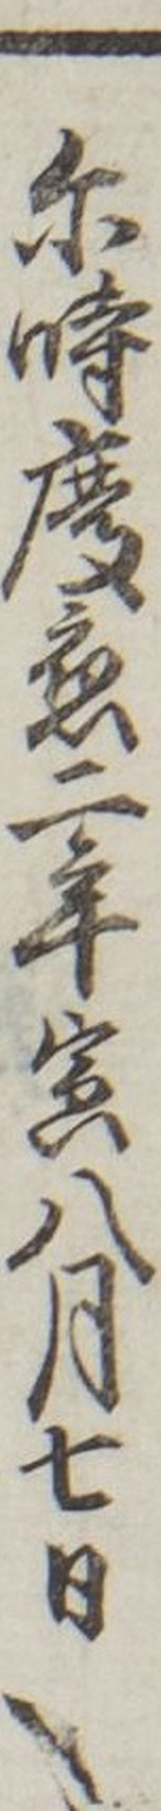尓時慶応二年寅八月七日
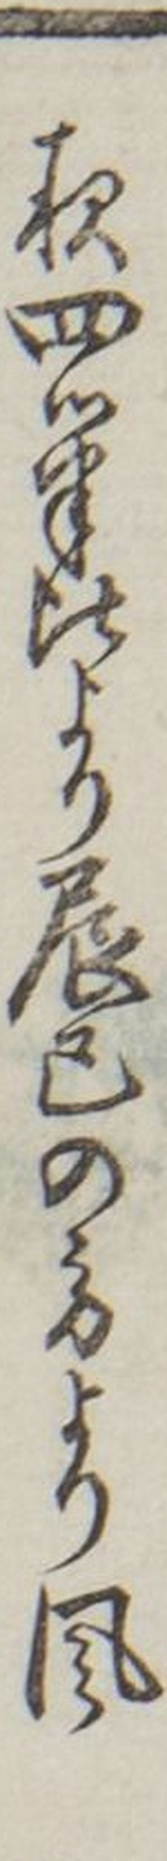夜四ツ半比より辰巳の方より風
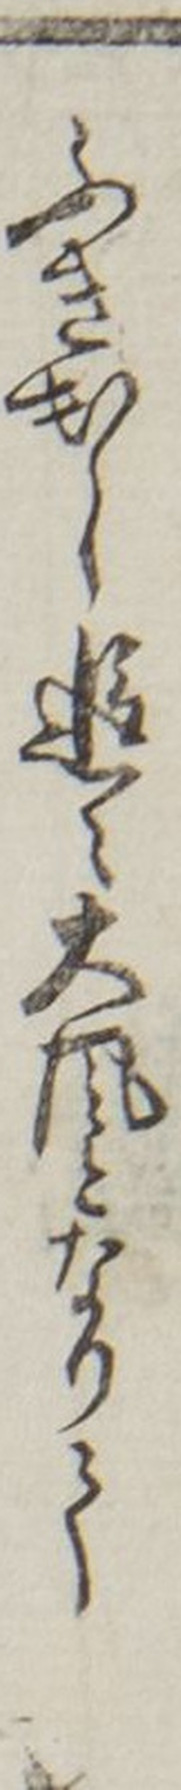ふき出し追々大風となりて
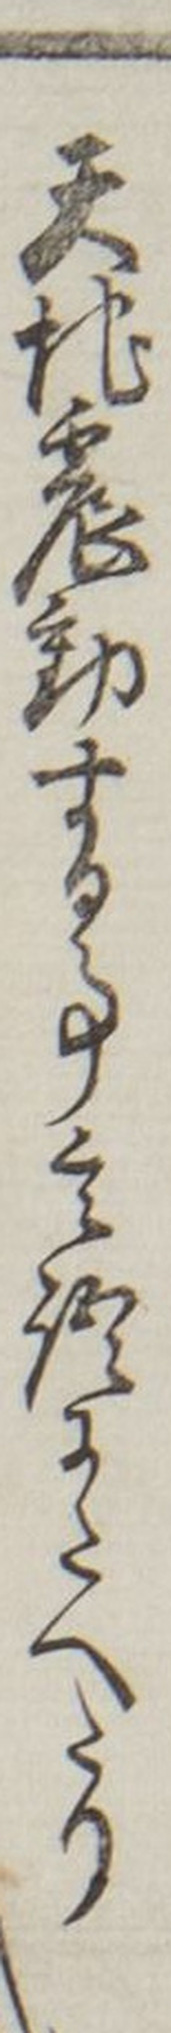天地震動する事言語にたへたり
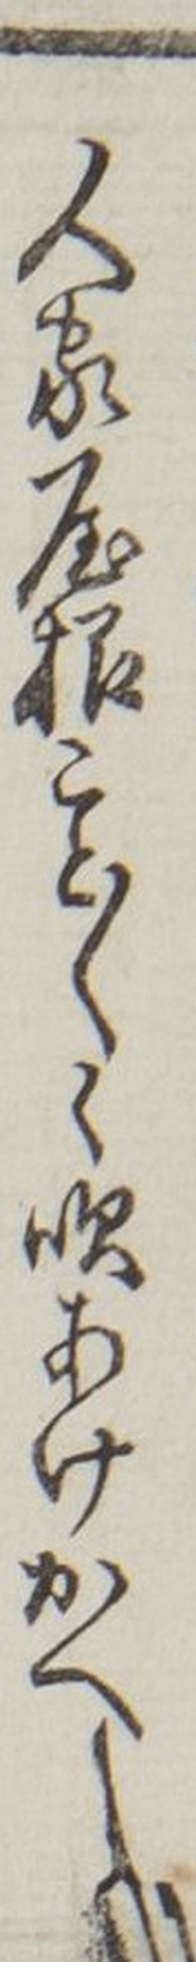人家屋根こと〳〵く吹あけかへ
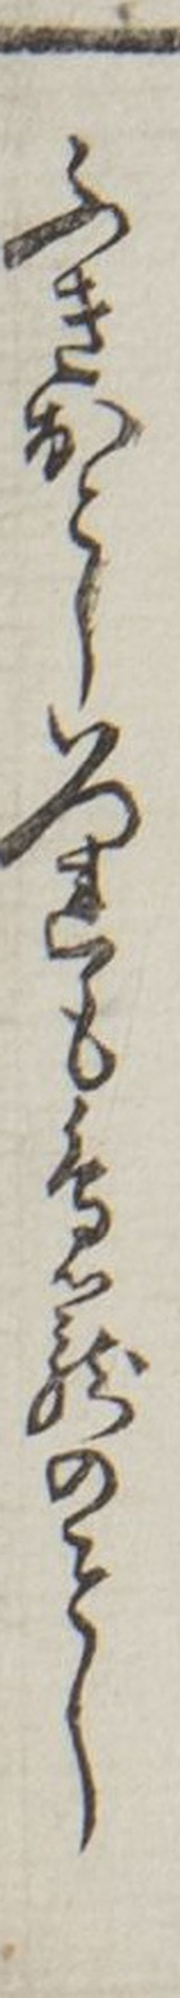ふきおとしいつれも鳥籠のことし
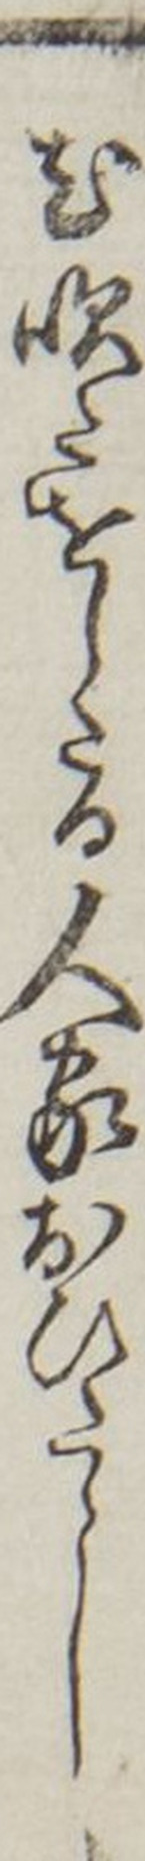尤吹たをしたる人家おひたゝし
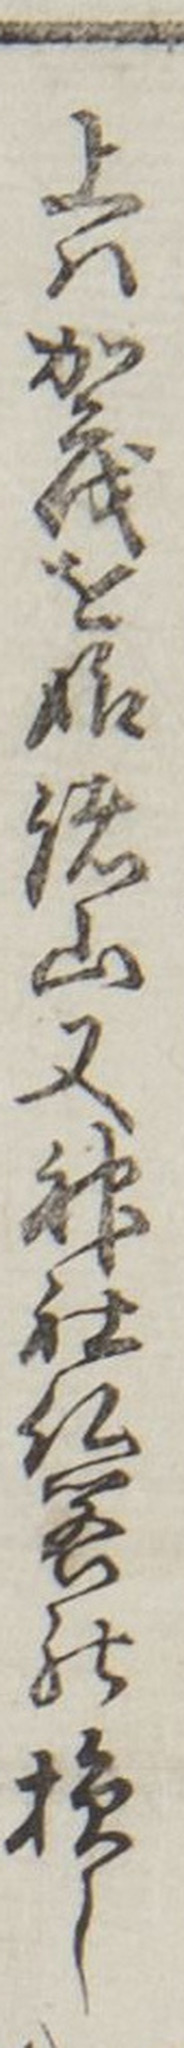上は加茂を始諸山又神社仏閣の損し
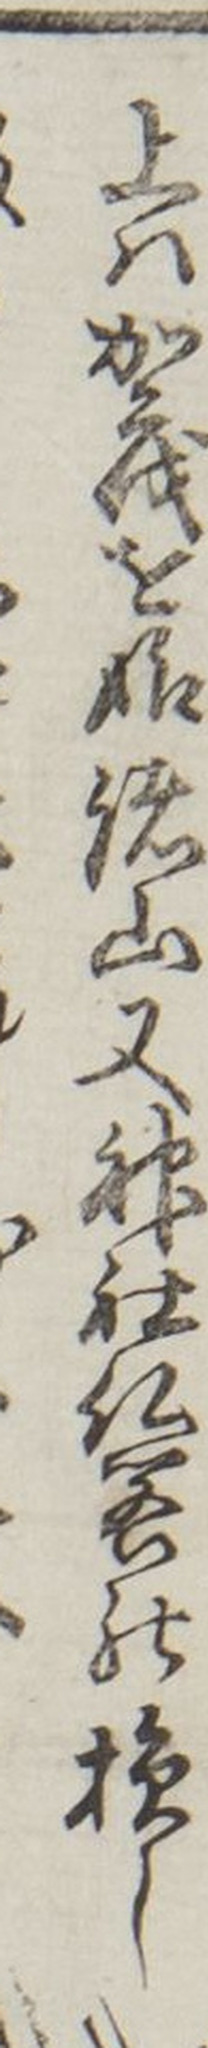上は加茂を始諸山又神社仏閣の損し
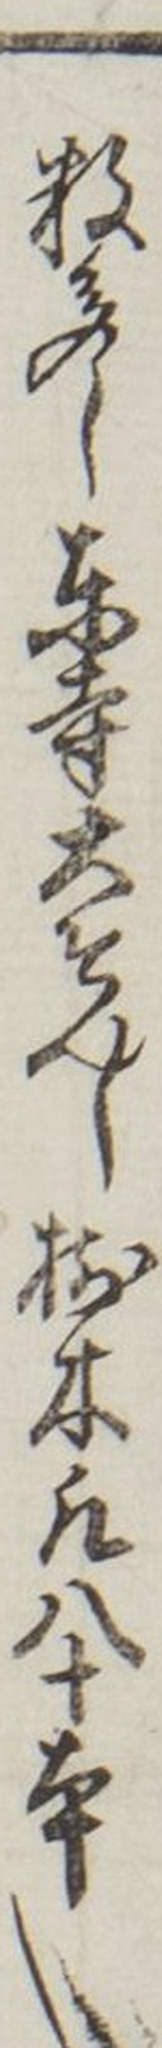数多し東寺大そんし樹木凡八十本
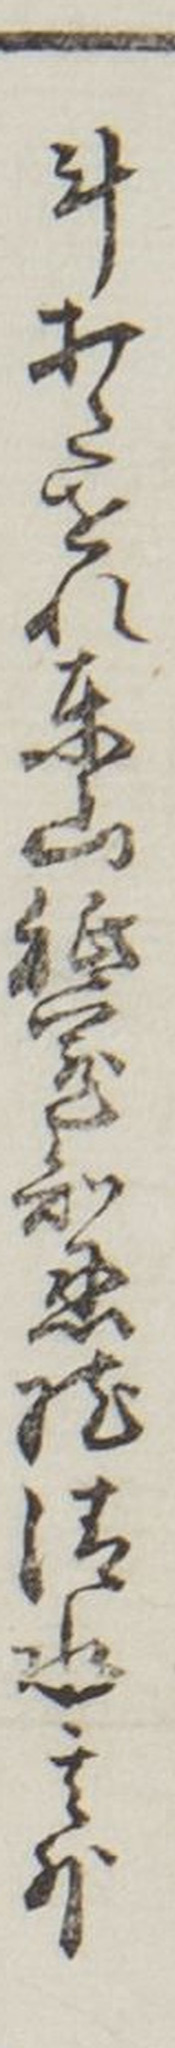計打たをれ東山祇園知恩院清水其外
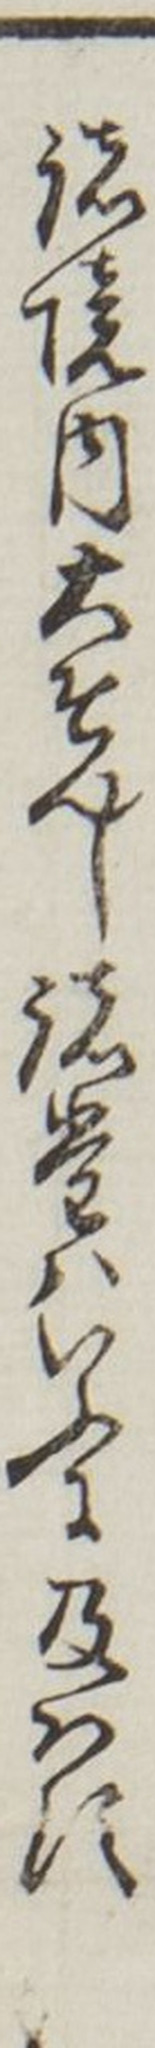諸境内大そんし諸堂はいふに及はす
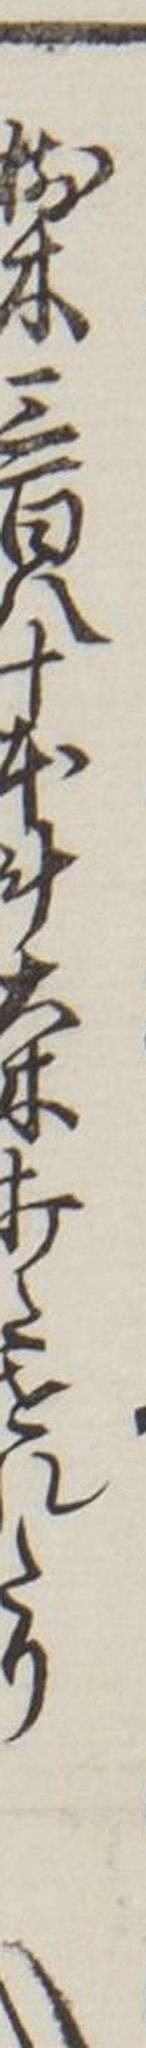樹木三百八十本計大木打たをれたり
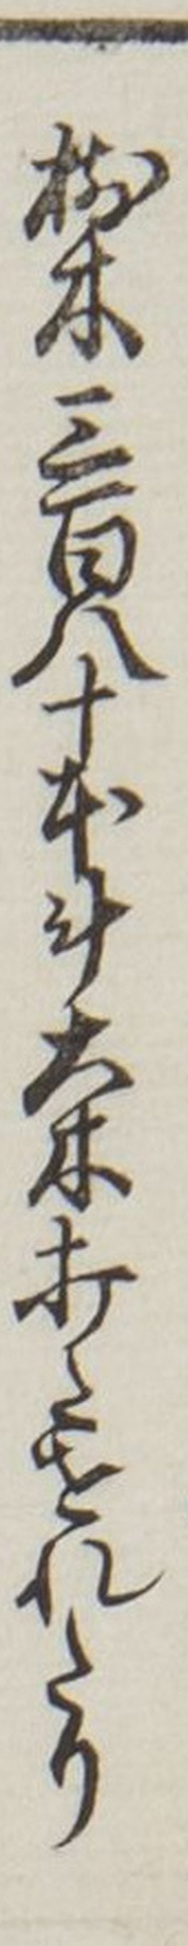樹木三百八十本計大木打たをれたり
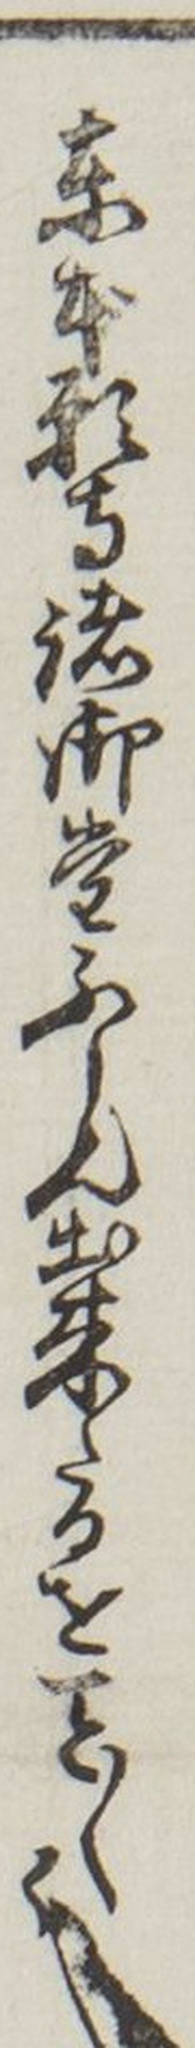東本願寺諸御堂ふしん出来たるをこと〳〵く
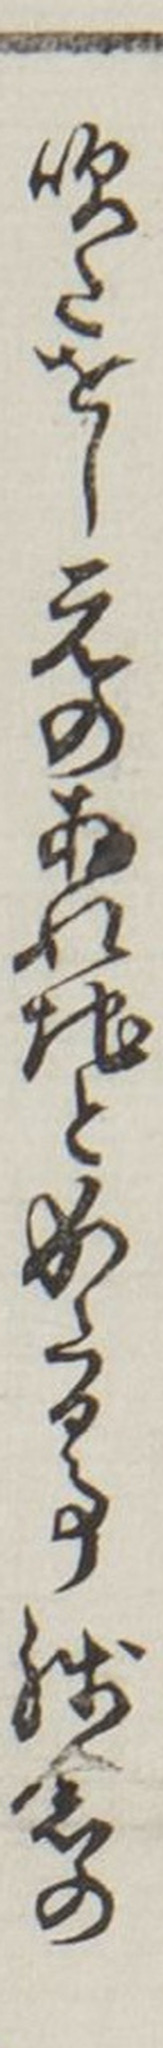吹たをし元のあれ地と成たる事残念の
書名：慶応二年京坂地方大風雨之図
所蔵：あいおいニッセイ同和損保株式会社
